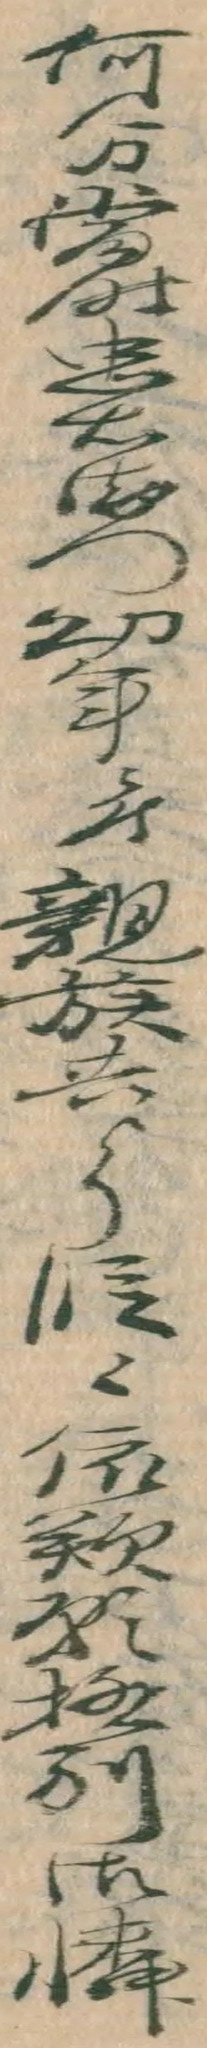何分當時忠右衛門幼年ニ付親族共より段々依歎願格別御憐
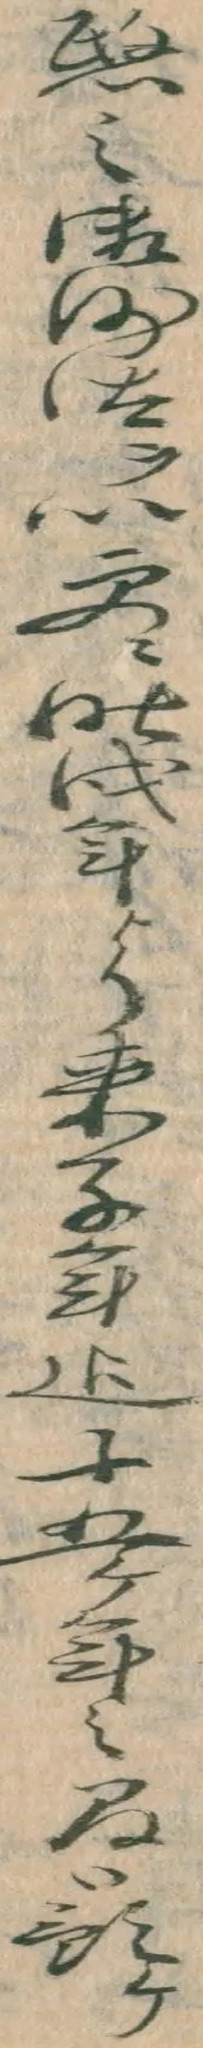憫之御沙汰ヲ以更ニ昨戌年より来子年迄十五ケ年之間御預ケ
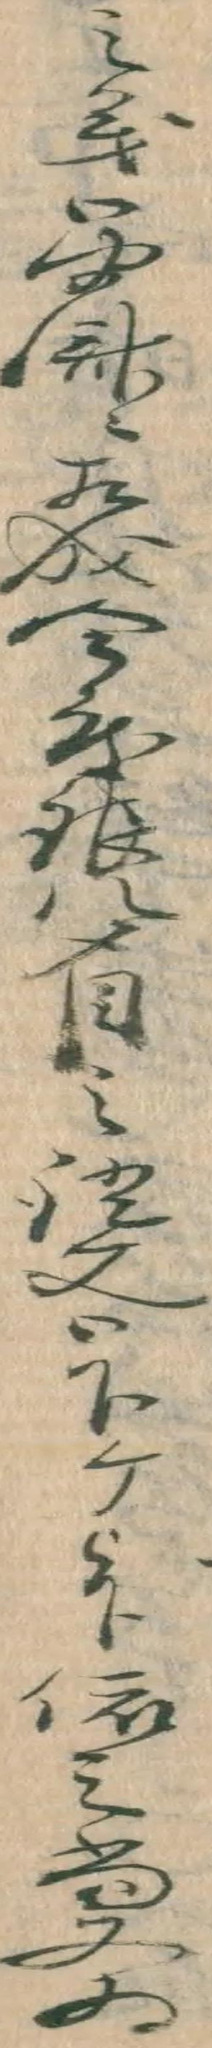之義御用済に相成今度銀八貫目之證文は下ケ被下依之尚又為
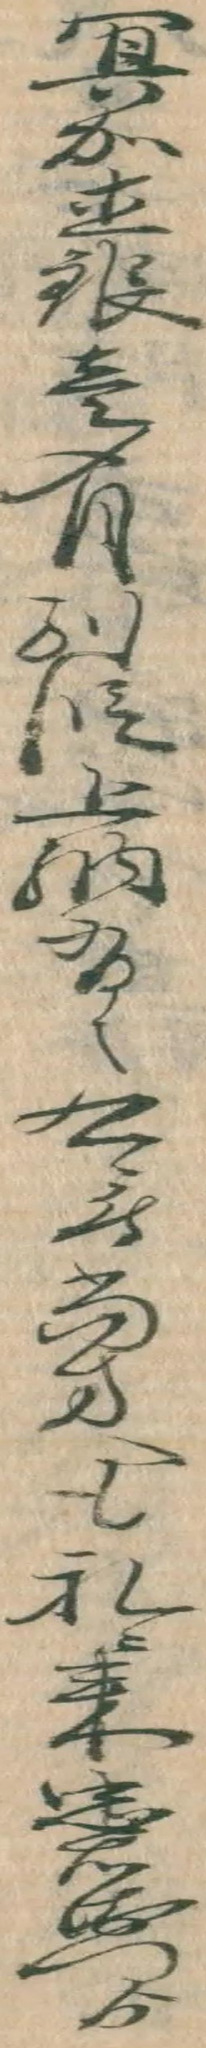冥加直銀壱〆目別段上納有之右ニ付當方へも礼ニ来忠右衛門ゟ
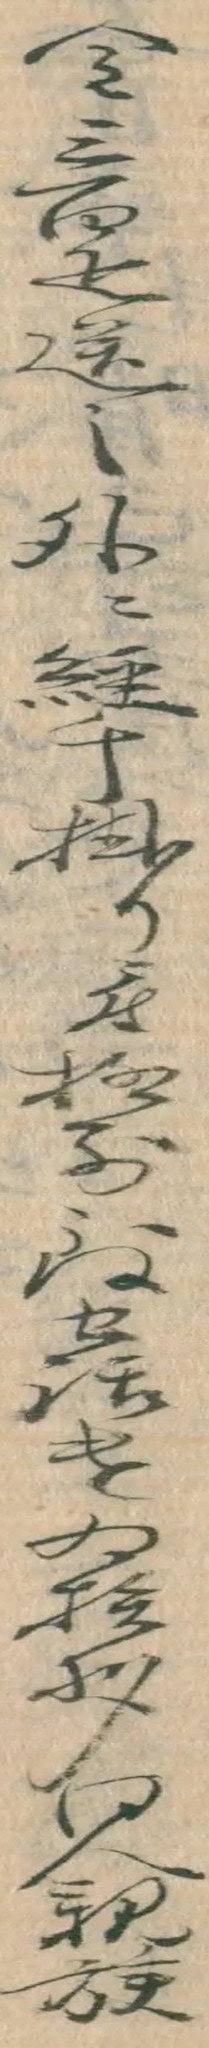金三百疋送之外に経千掛リニ付格別致世話遣為挨拶候同人親族
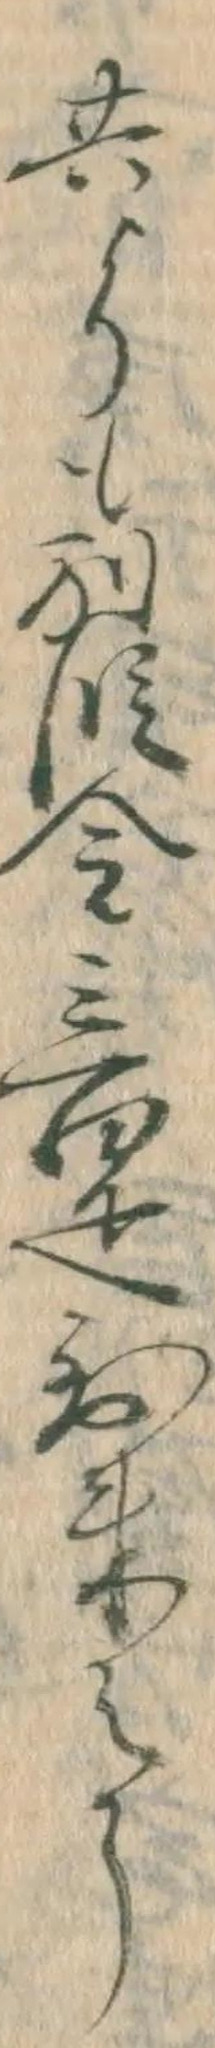共よりも別段金三百疋到来之事
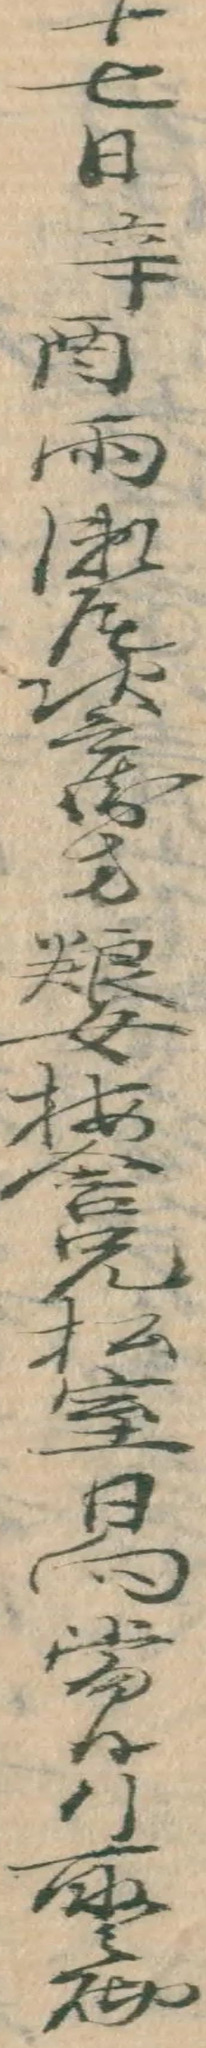十七日辛酉雨瀬尾次兵衛方養女梅舎兄松室日向當日引取之砌
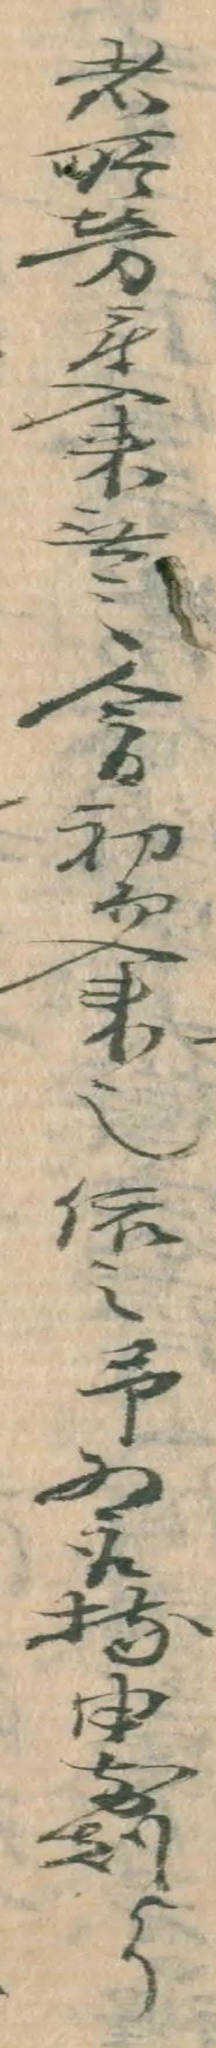者所労ニ付入来無之今日初而入来也依之予為取持申前刻より
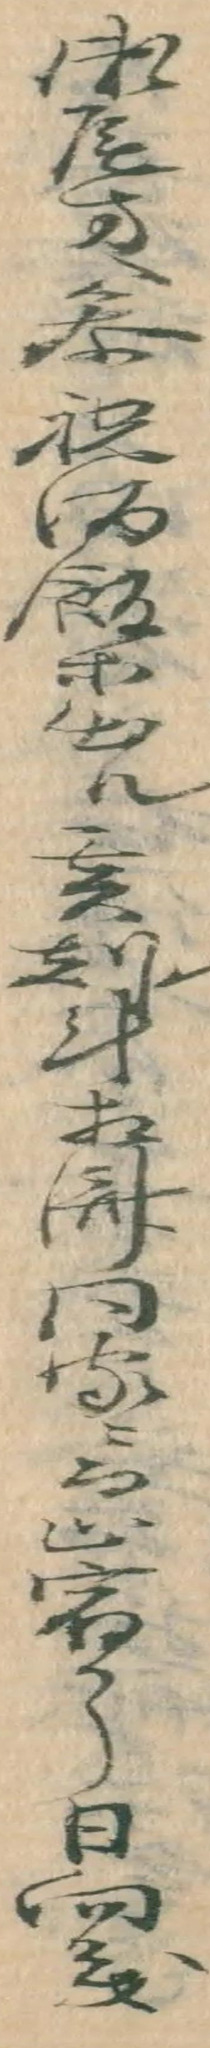御屋方へ参祝酒飯等出ル亥刻斗相済同家ニ而止宿了日向義

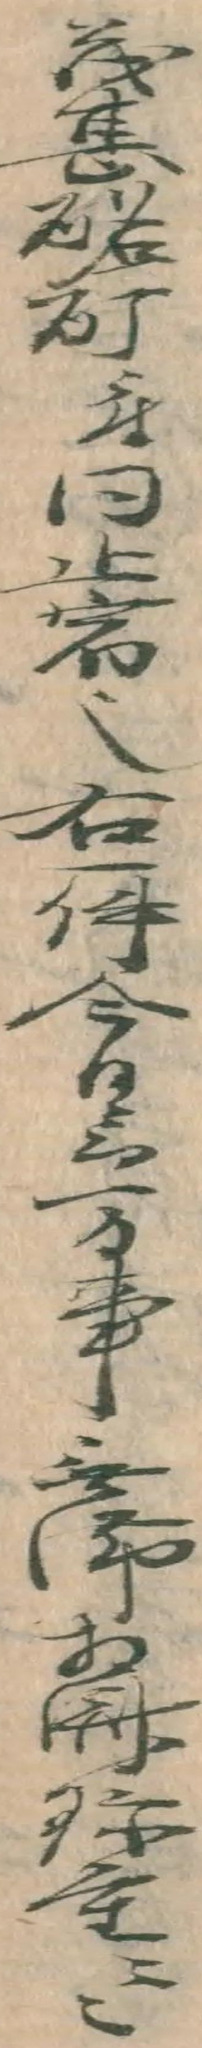茂甚酩酊ニ付同止宿也右一件今日ニ而万事無滞相済珍重々々
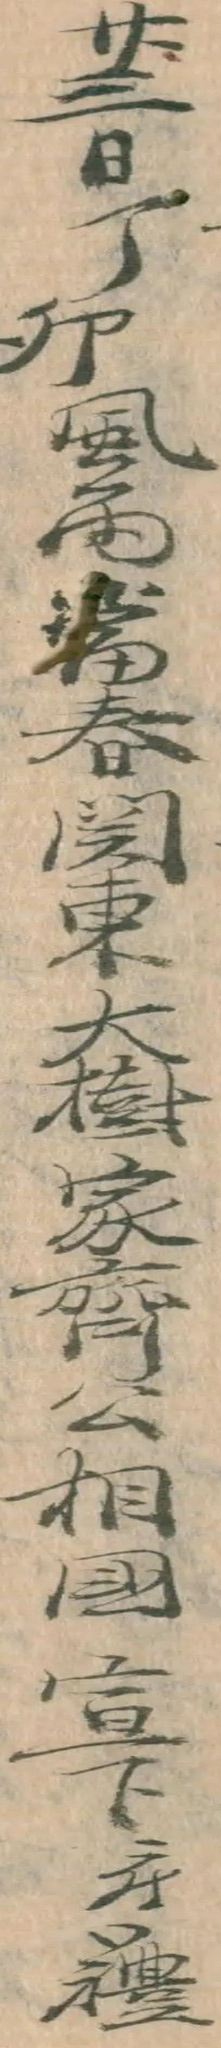廿三日丁卯風雨當春関東大樹家齋公相國宣下ニ付御禮
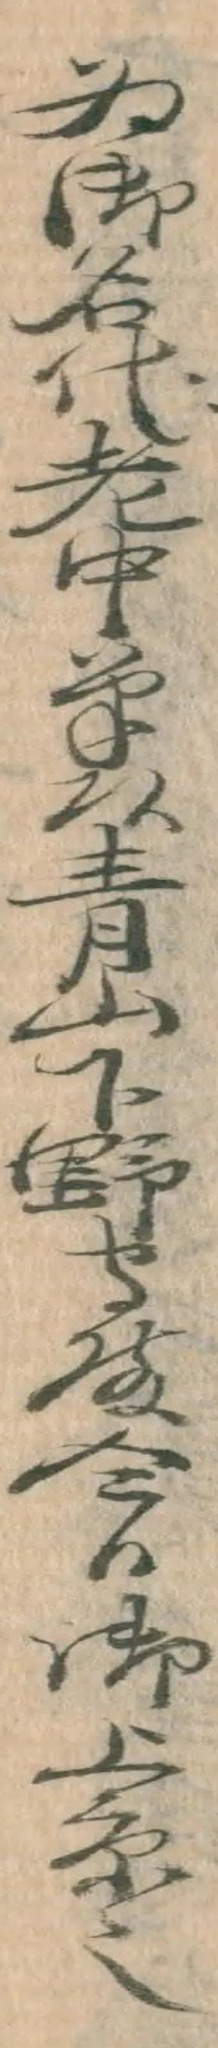為御名代老中筆頭青山下野守殿今日御上京也
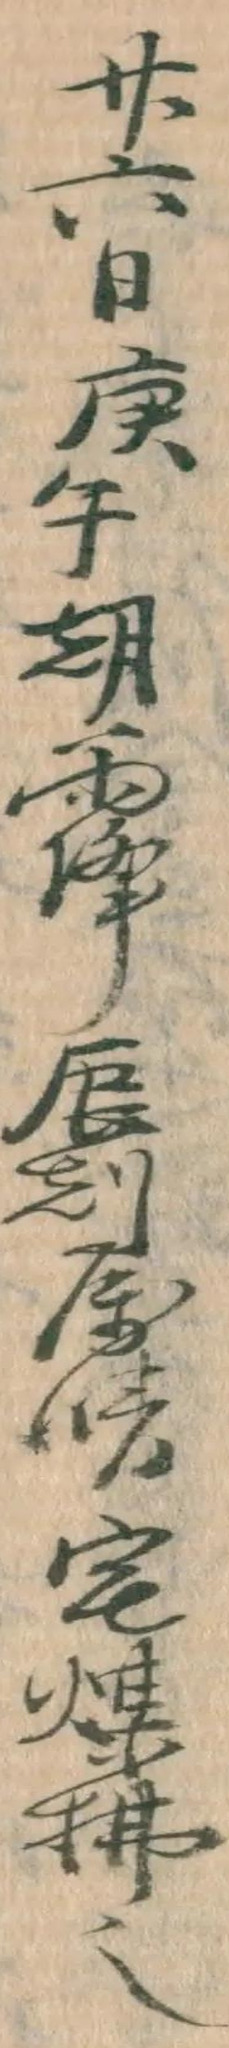廿六日庚午朝雨降辰刻属晴宅煤払也
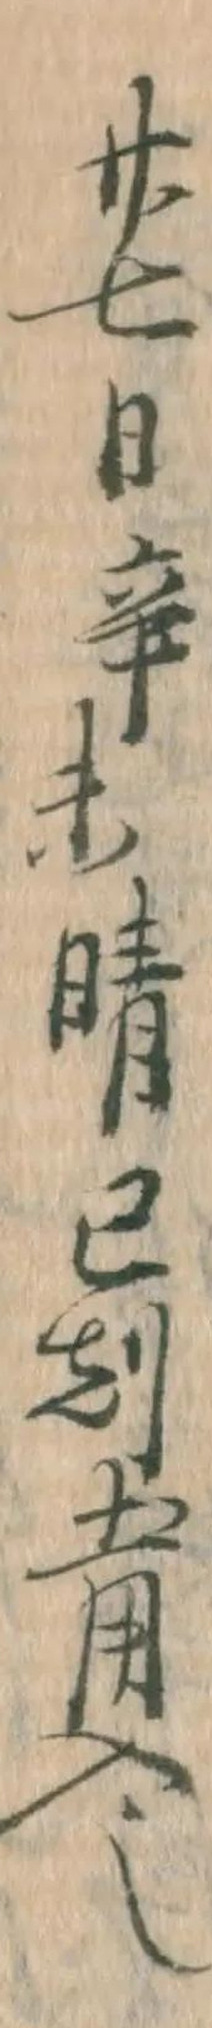廿七日辛未晴巳刻出用入之
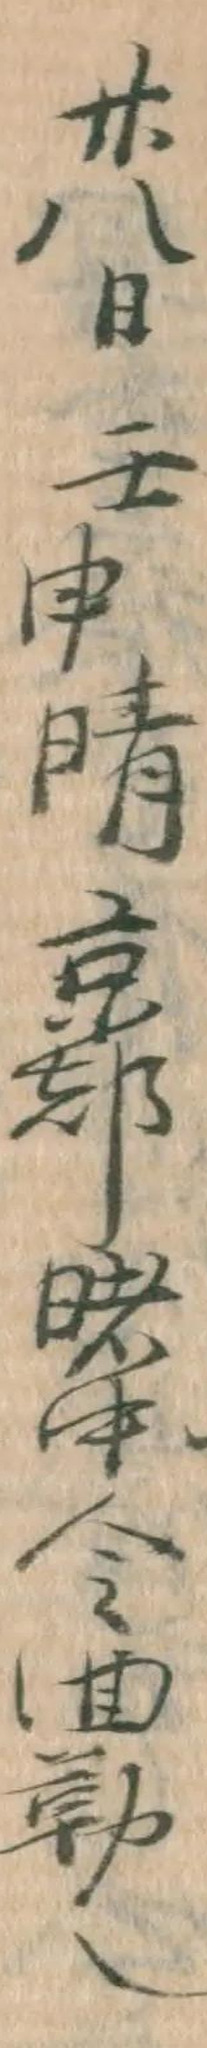廿八日壬申晴京都賭中人之回勤之
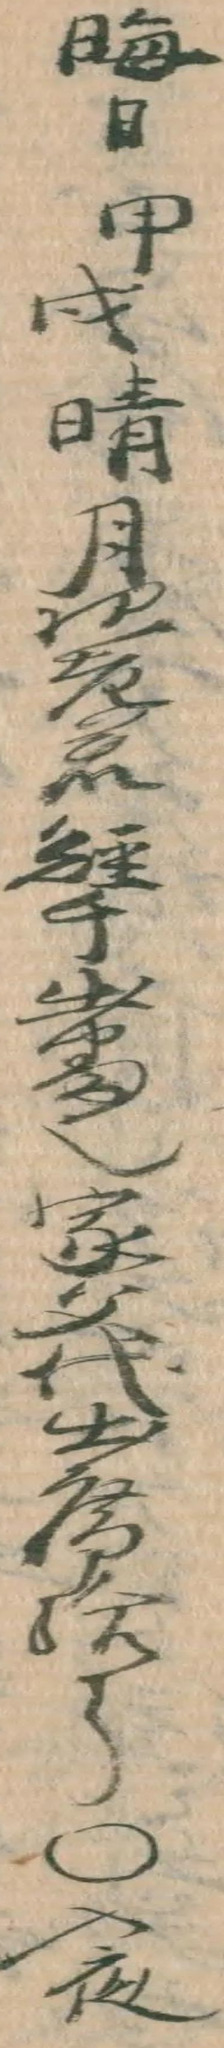晦日甲戌晴月次老若経千出番也家父代出席給了○入夜
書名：賀茂社記録. 第65冊
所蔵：国立国会図書館 National Diet Library, JAPAN
